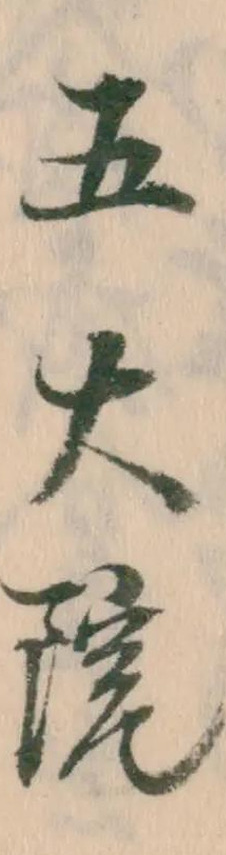五大院
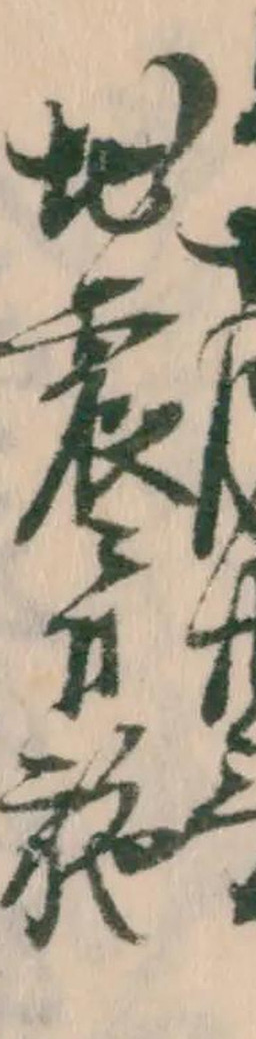地震ニ付施
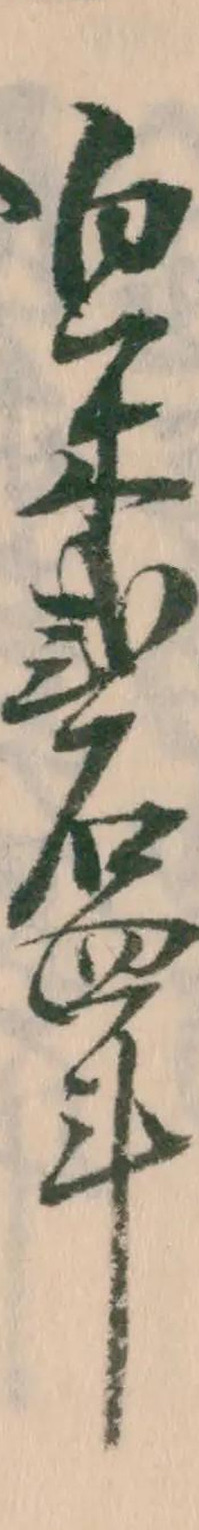一白米弐石四斗
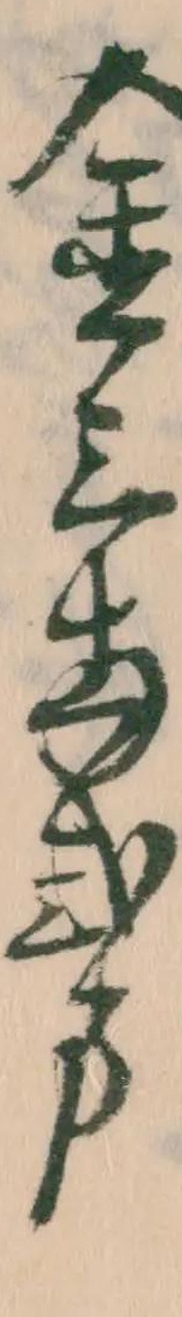金三両弐分
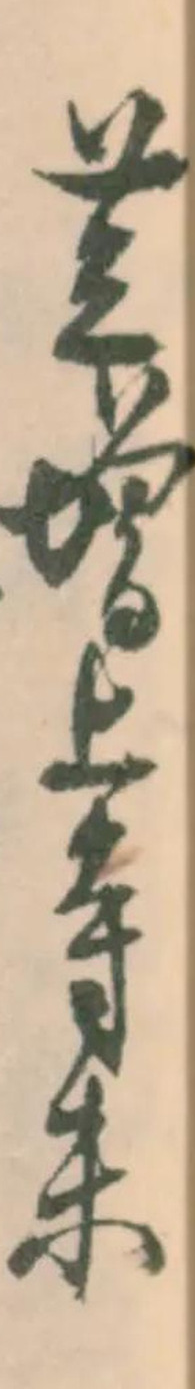芝増上寺末
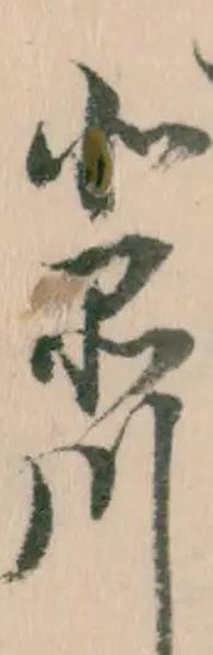北品川
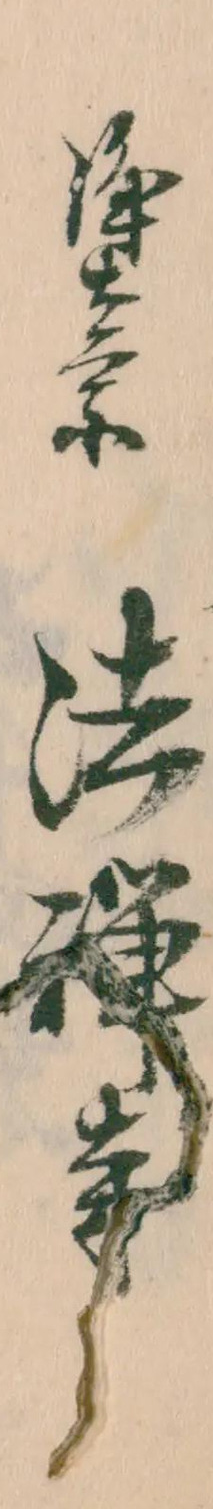浄土宗法禅寺
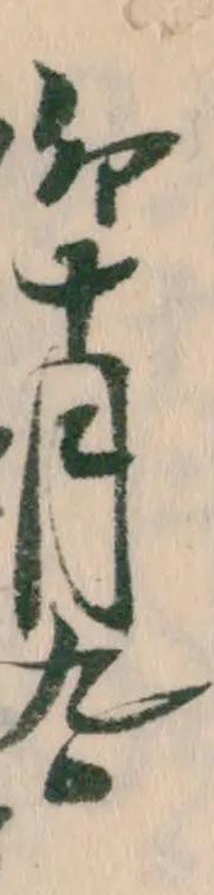卯十月九日
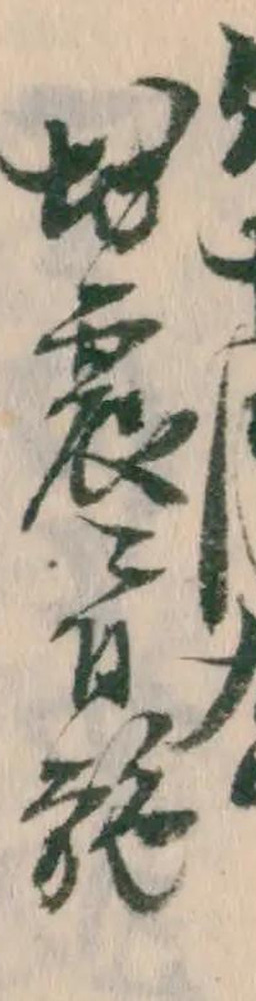地震ニ付施
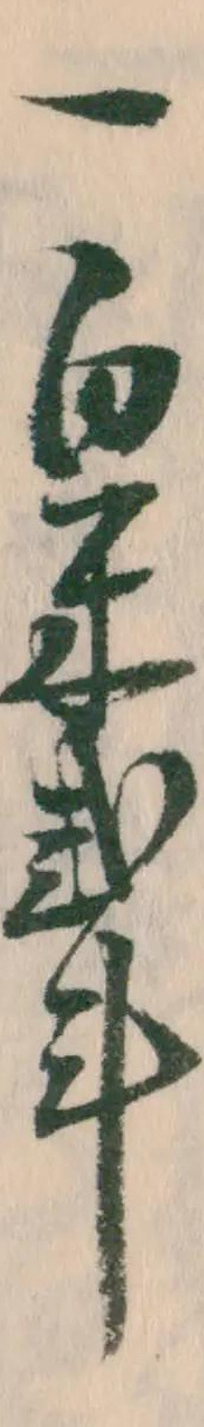一白米弐斗
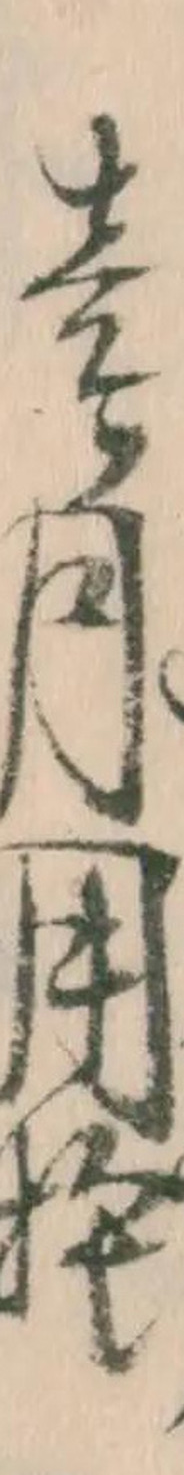壱ケ月用捨

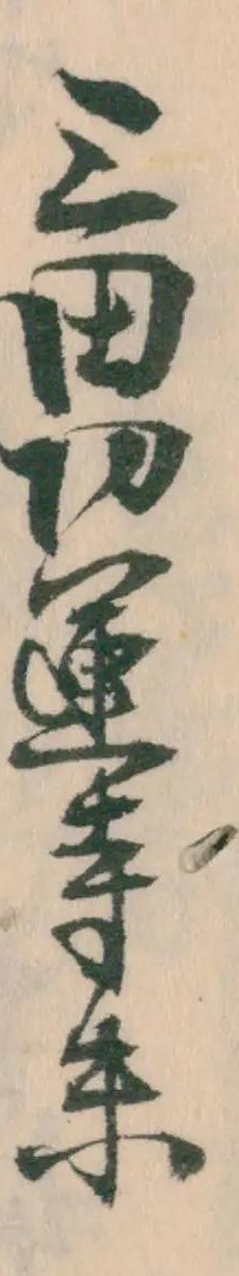三田功運寺末
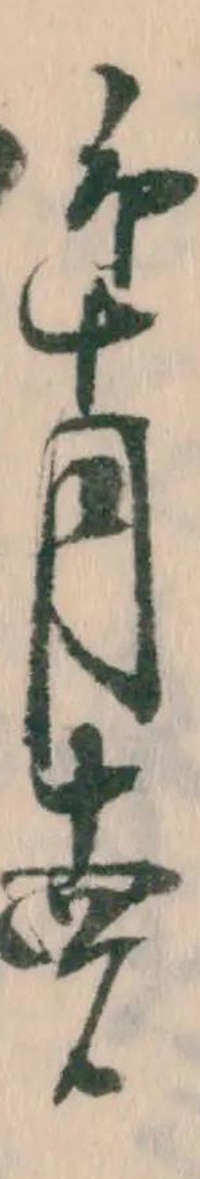卯十月十四日
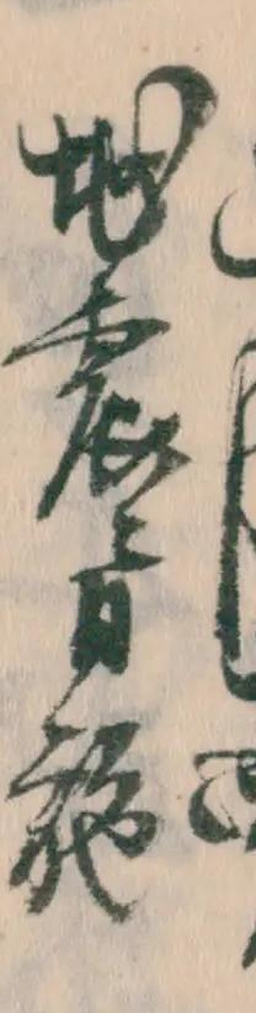地震ニ付施
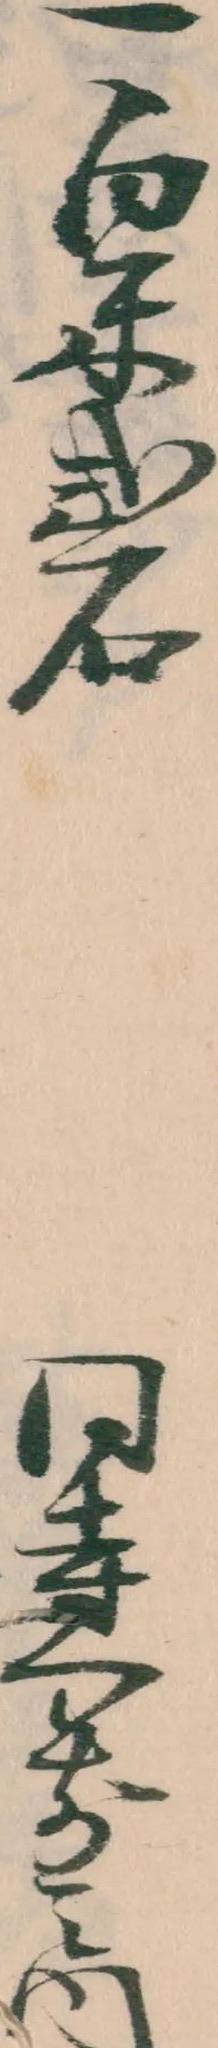一白米弐石同寺門前之内
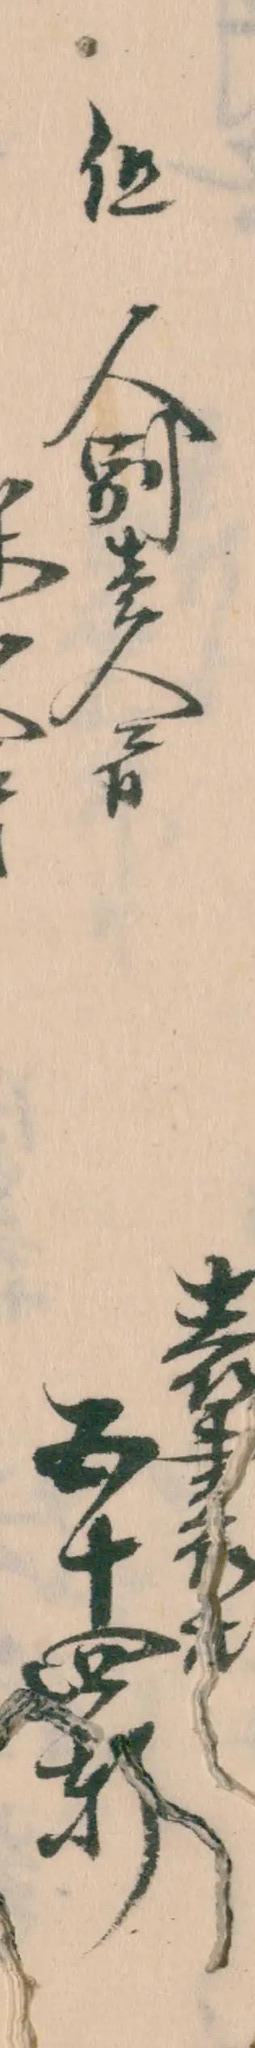但人別壱人ニ付表裏共
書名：武家方并寺院等ニテ施差出候一件
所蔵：国立国会図書館 National Diet Library, JAPAN
